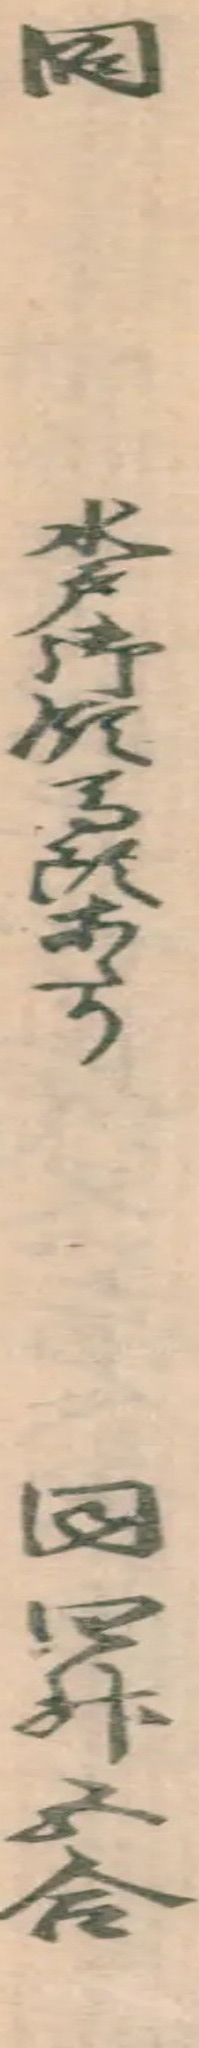同水戸御領馬頭あたり同四升五合
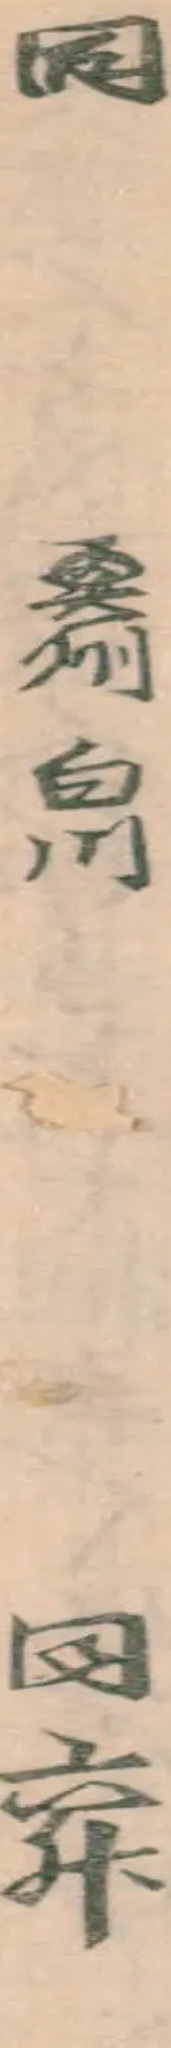同奥州白川同六升
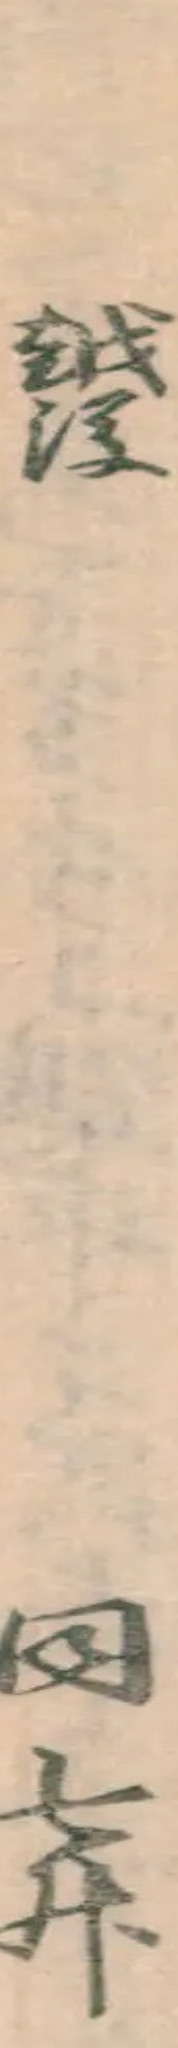同越後同七升
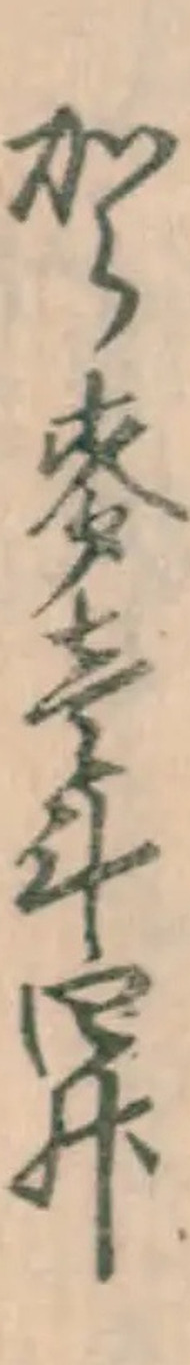同同から麦壱斗四升
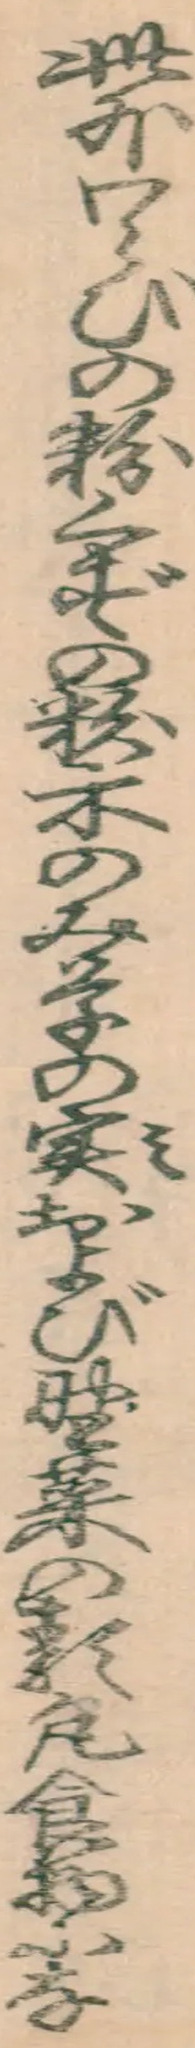此外わらびの粉くずの粉木のみ草の実および野菜の類凡食物にな
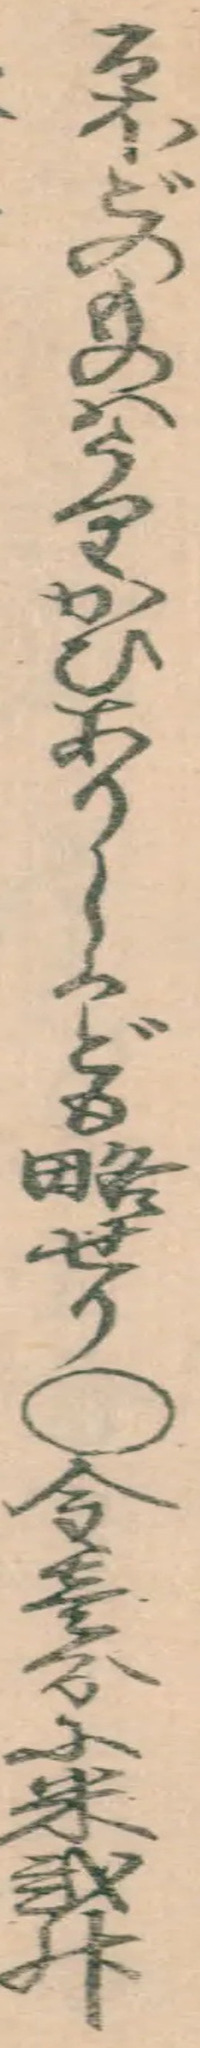るほどのものはうりかひありしかども略せり○金壱分に米弍升
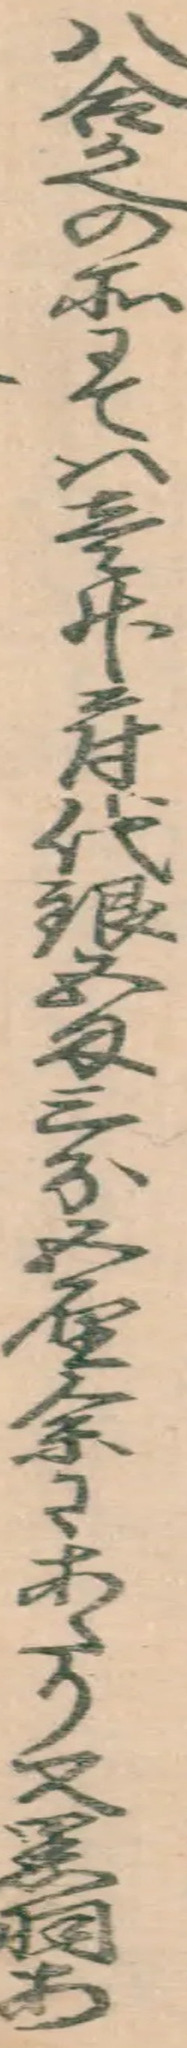八合かへの所にては壱升に付代銀五匁三分五厘余にあたり又黒羽あ
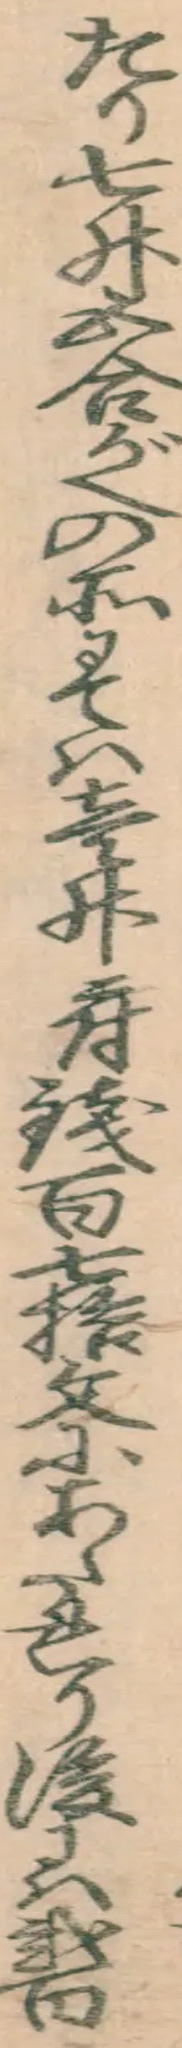たり七升五合がへの所にては壱升に付銭百七拾文にあたれり後には弍百
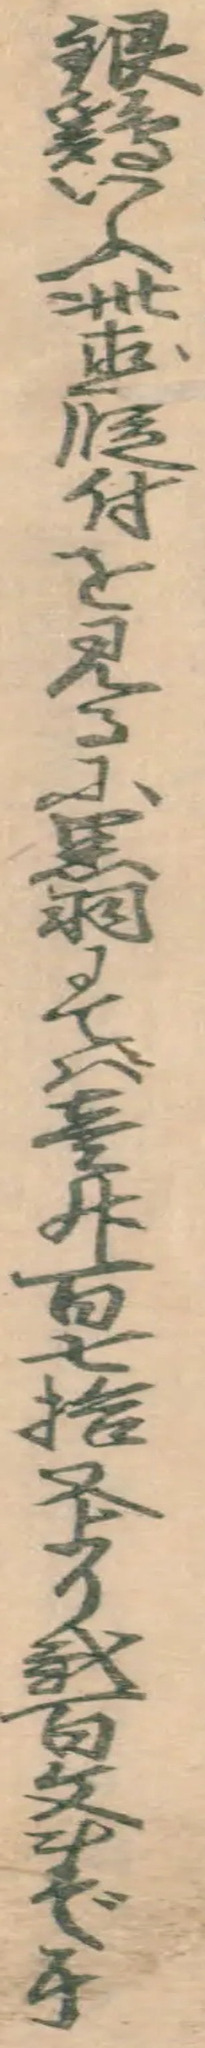銀鶏いふ此直段付を見るに黒羽にては壱升百七拾文より弐百文までに

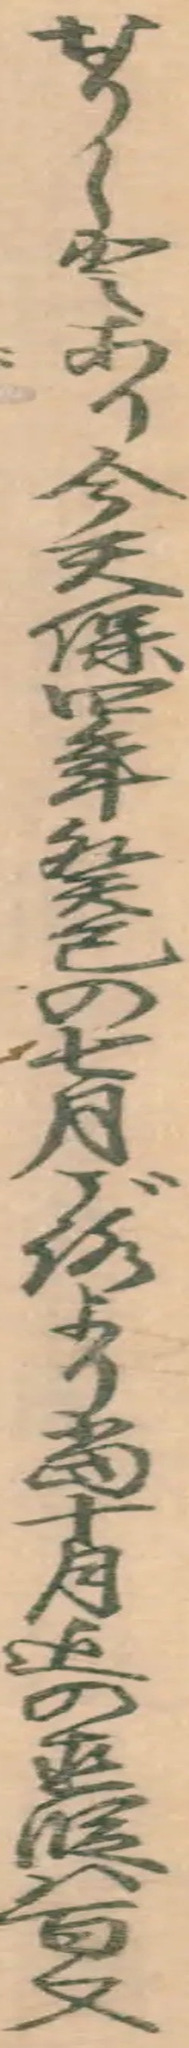なりしとあり今天保四年癸巳の七月ごろより当十月迄の直段は百文
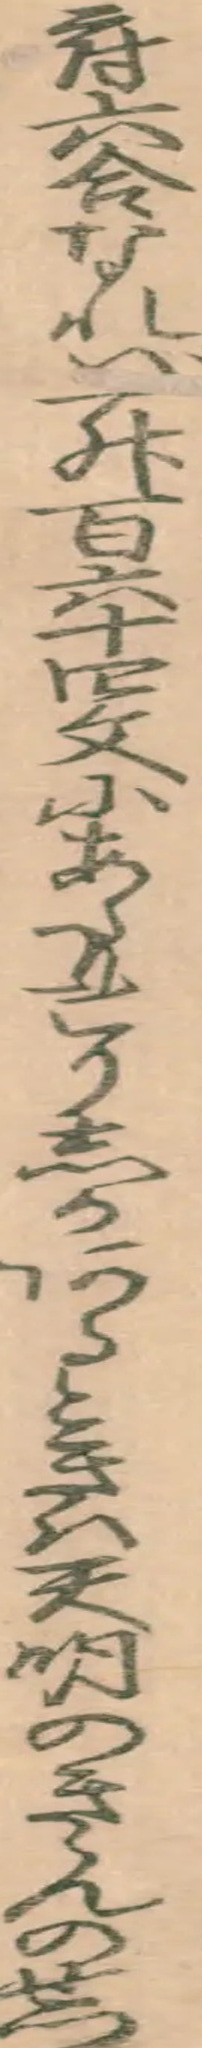に付六合なれば一升百六十四文にあたれりしかあるときは天明のきゝんのせつ
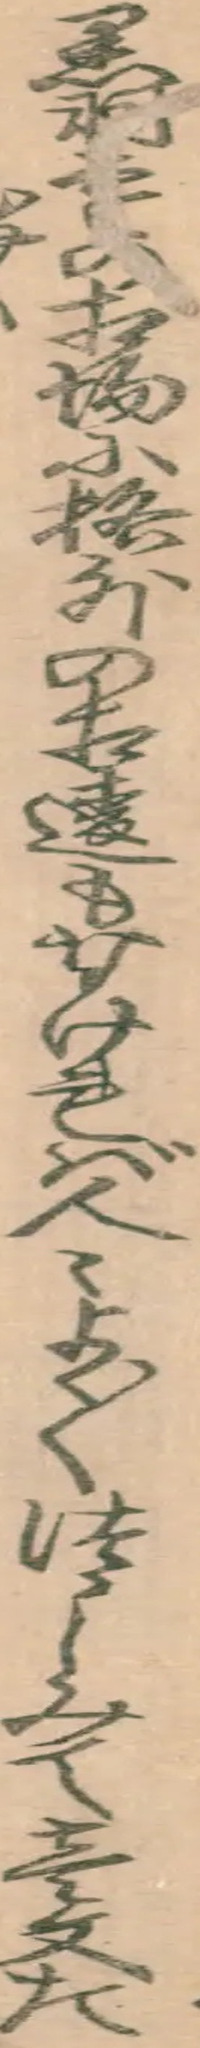黒羽の相場に格外の相違もなければ人々よく〳〵つゝしみて壱文た
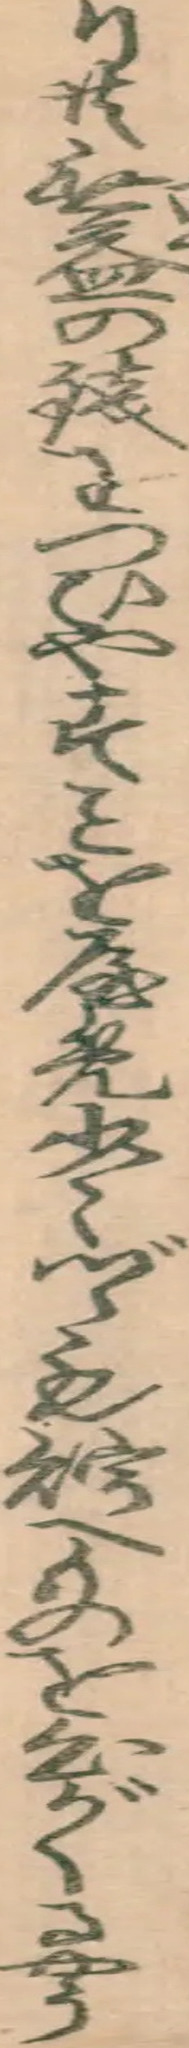り共無益の銭をつひやすことをやめ少々づゝも貯へものを心がくるやう
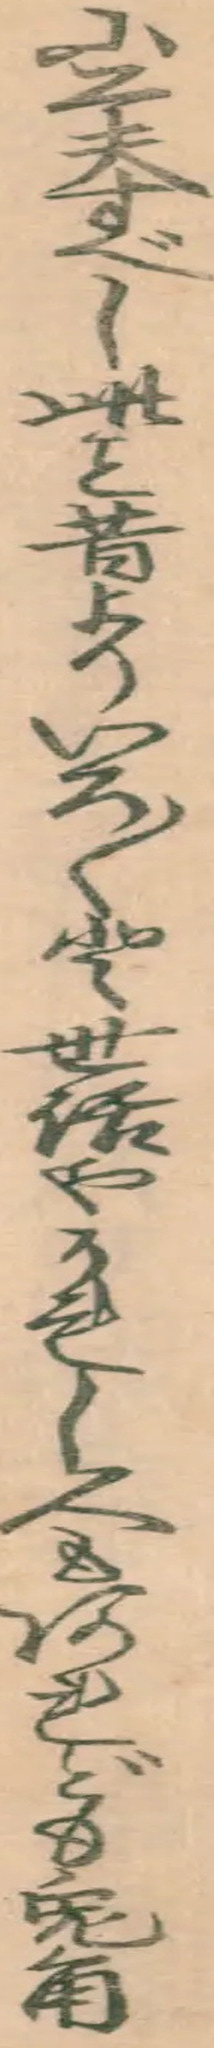に工夫すべし此こと昔よりいろ〳〵と世話やかれし人もあれども兎角
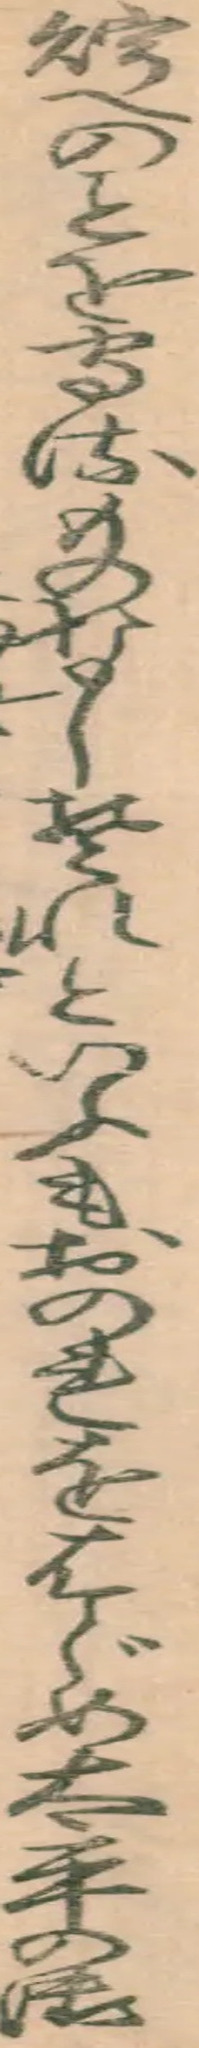貯へのことを守るものなしそれといふもおのれをはじめ太平の御
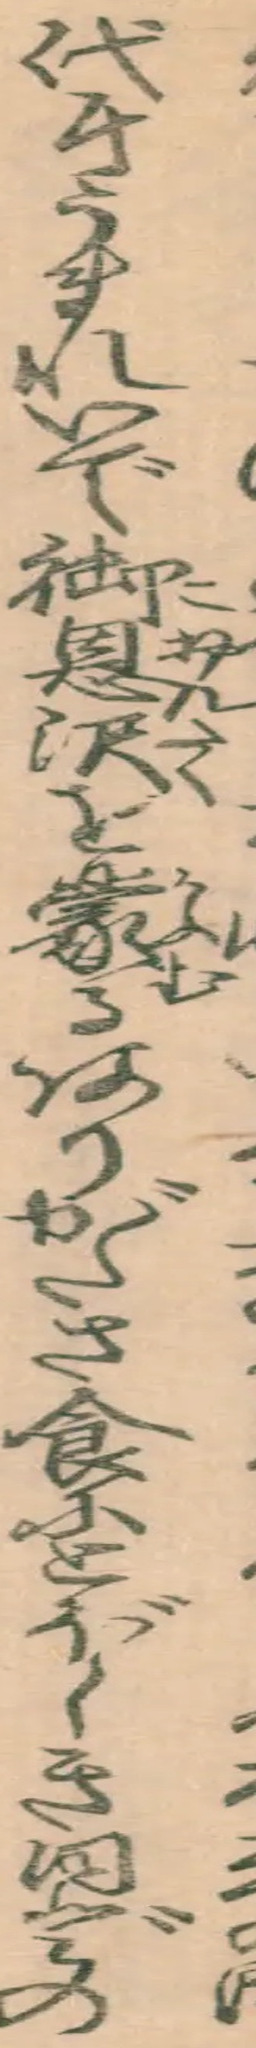代にうまれいで御恩沢を蒙るありがたさ食にとぼしきほどの
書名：日ごとの心得
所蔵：国立国会図書館 National Diet Library, JAPAN
